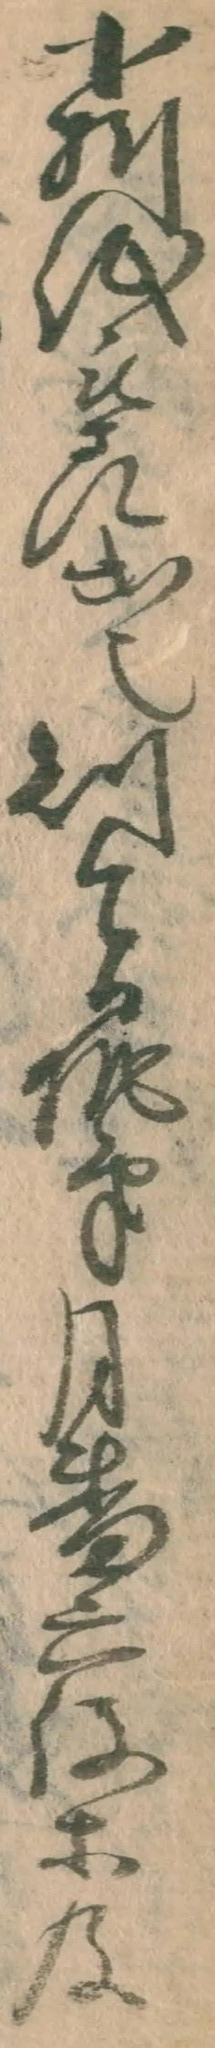小折紙被差出也則今日執筆月番六役等及
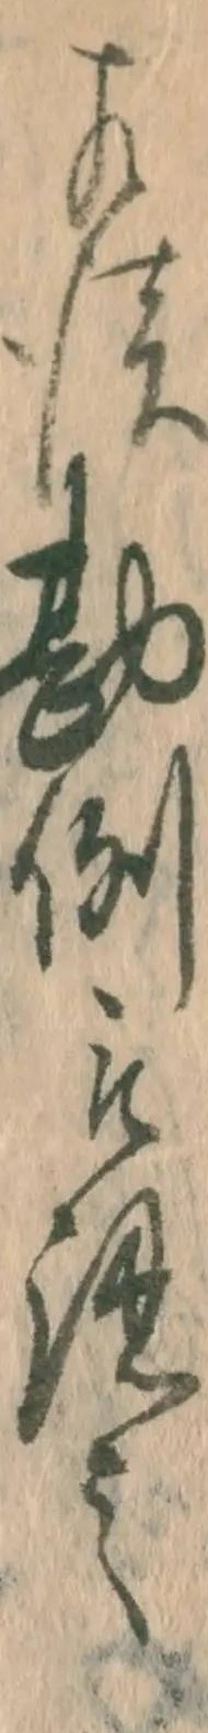相談勘例被認之
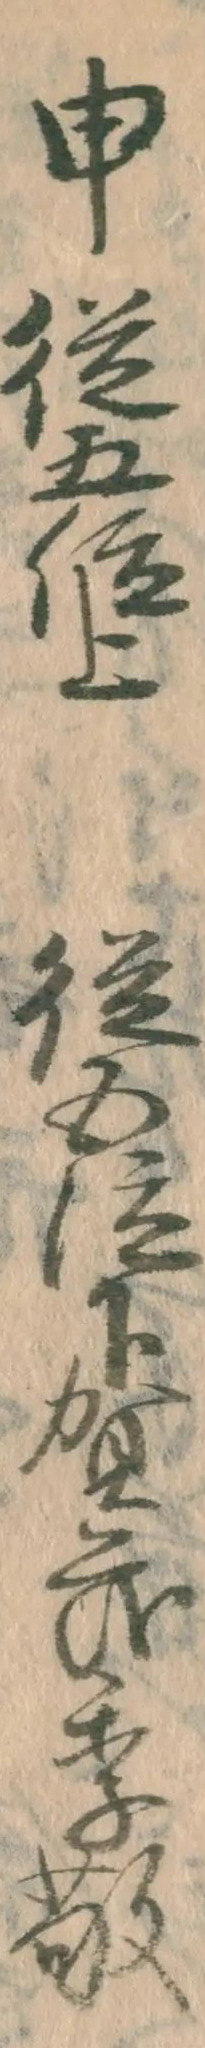申従五位上従五位下賀茂季敬
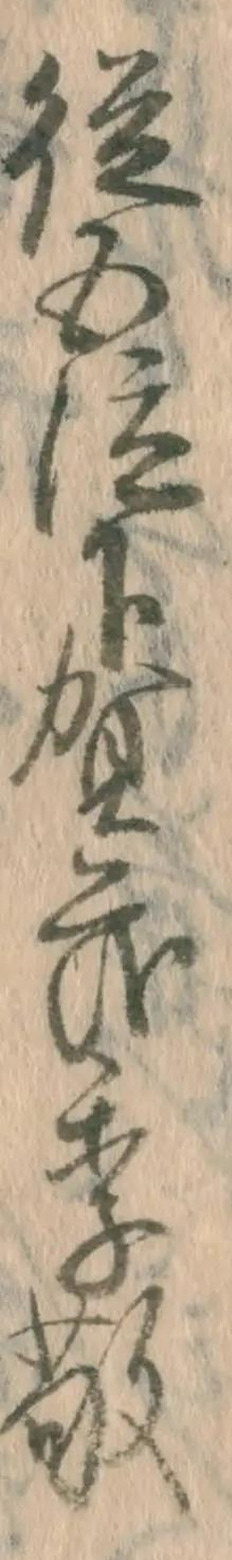従五位下賀茂中直
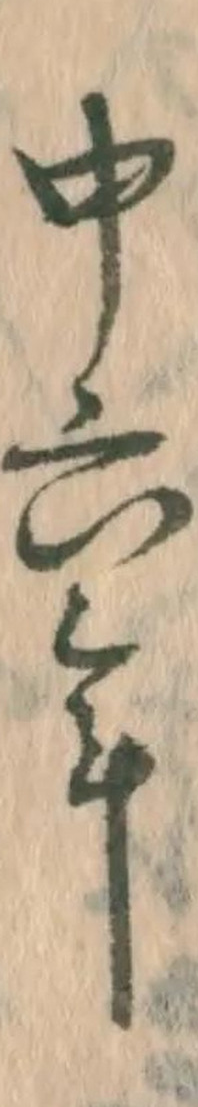中六年
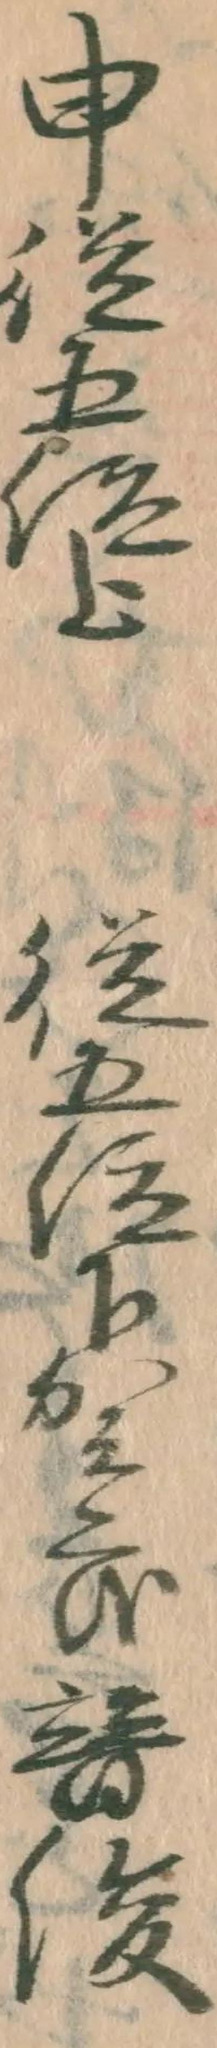申従五位上従五位下賀茂季敬
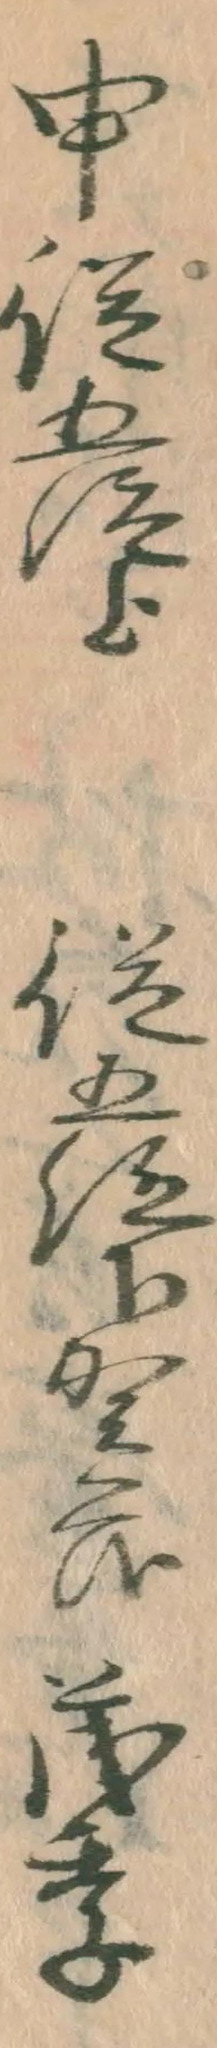申従五位上従五位下賀茂茂季
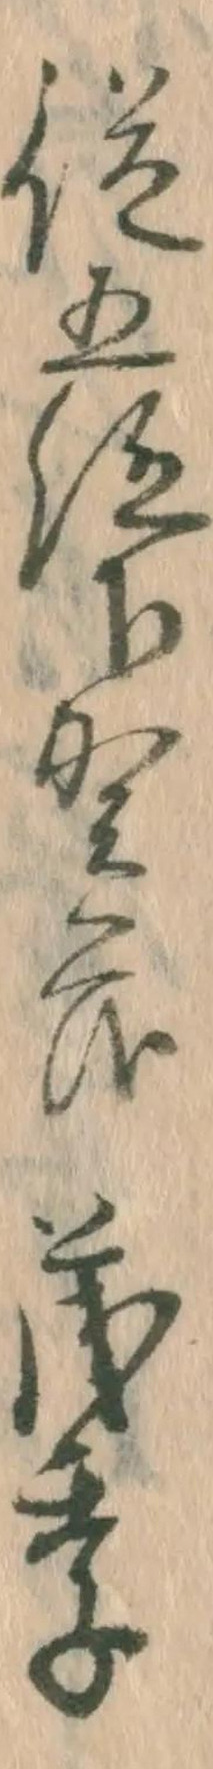従五位下賀茂中直
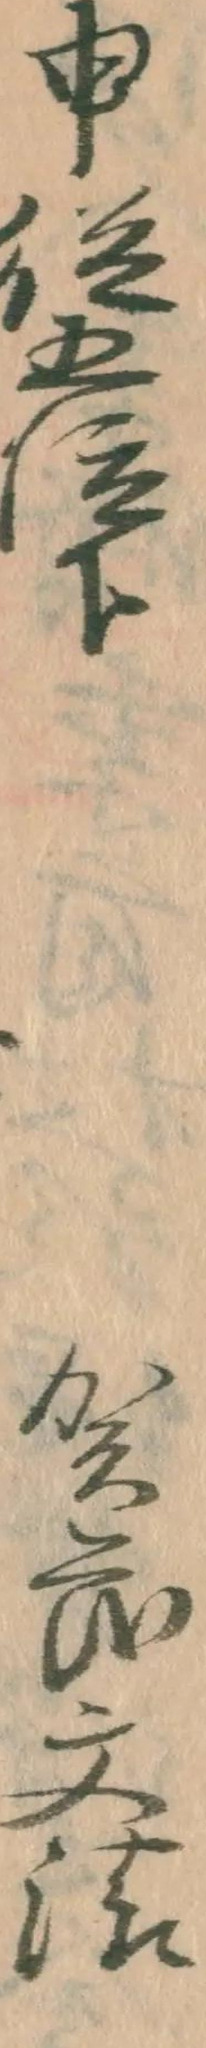申従五位下賀茂文清
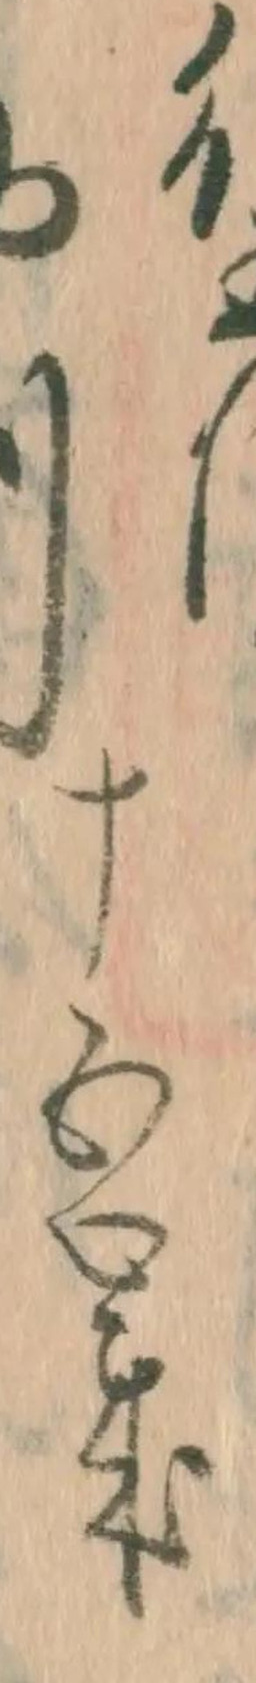勘例十五歳
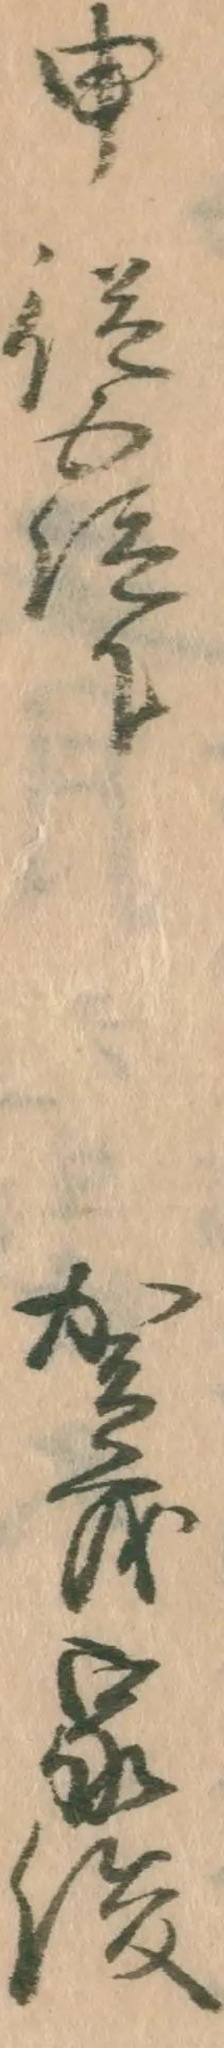従五位下賀茂家俊
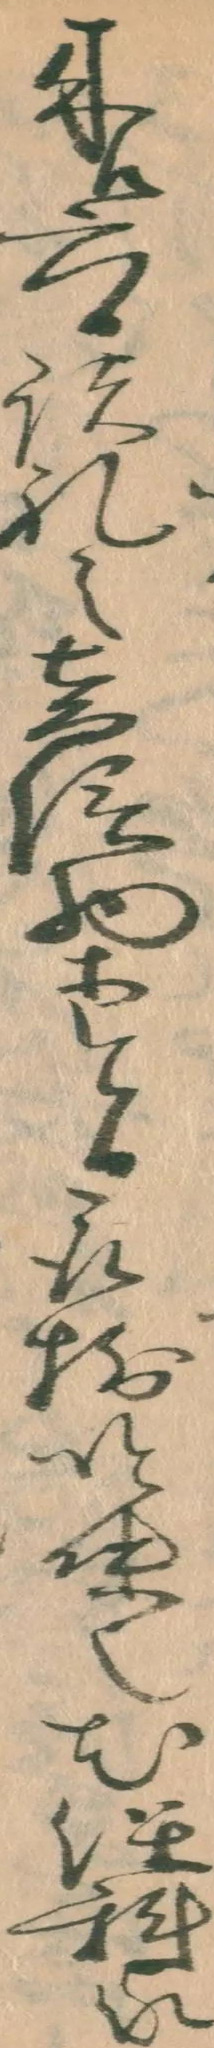来ル六日諸礼之音信物等今日取揃吟味也尤保科家
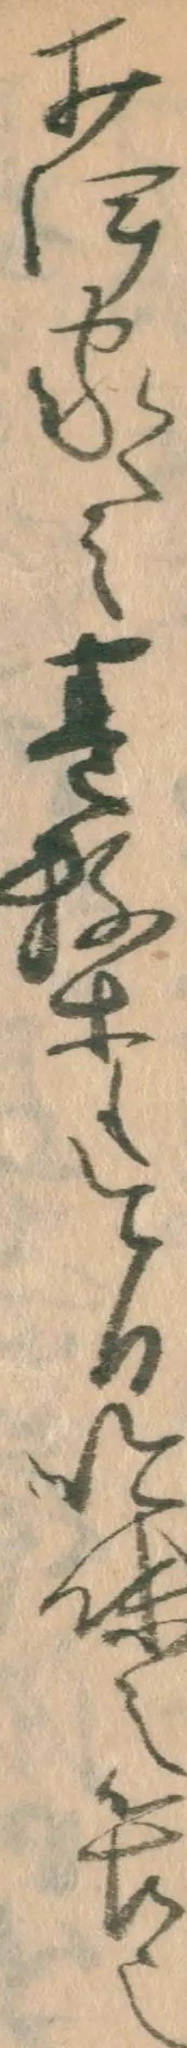井伊家へ之巻数等も今日吟味之筈也
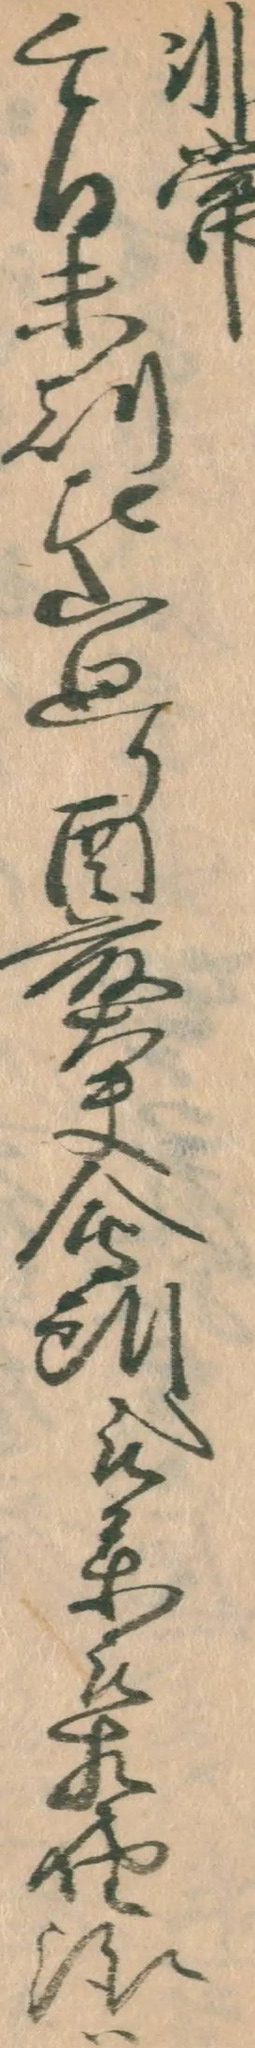今日未刻比山廻り酉藤大夫会所へ被参被相届趣ハ
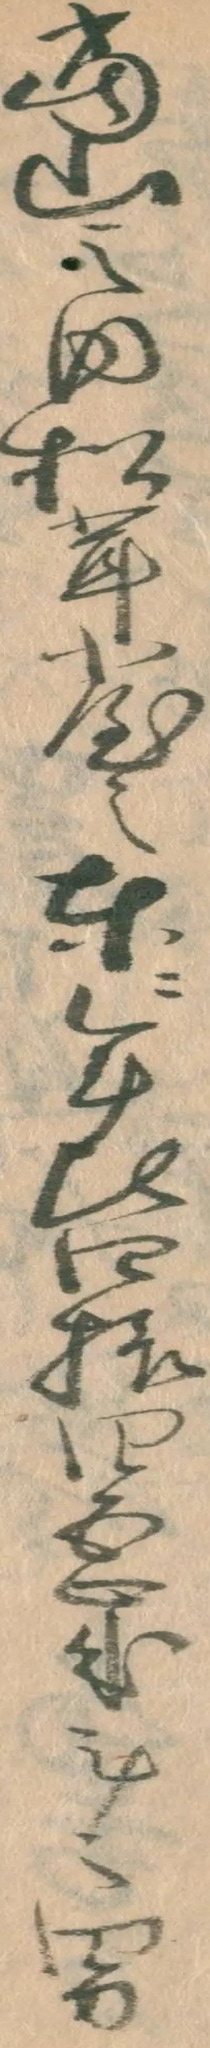当山之内松茸小屋之東ニ年比四拾四五歳計之男
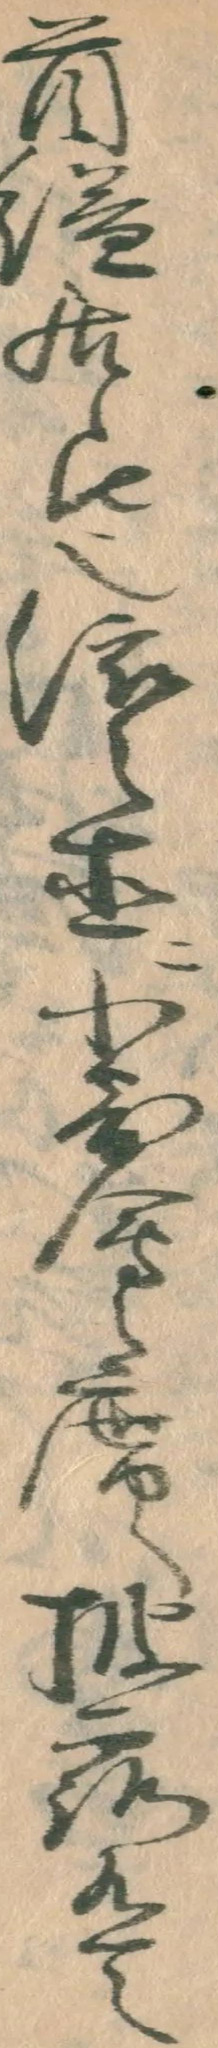首縊居候由也依之直ニ小寄会之席へ披露有之
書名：賀茂社記録. 第60冊
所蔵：国立国会図書館 National Diet Library, JAPAN
